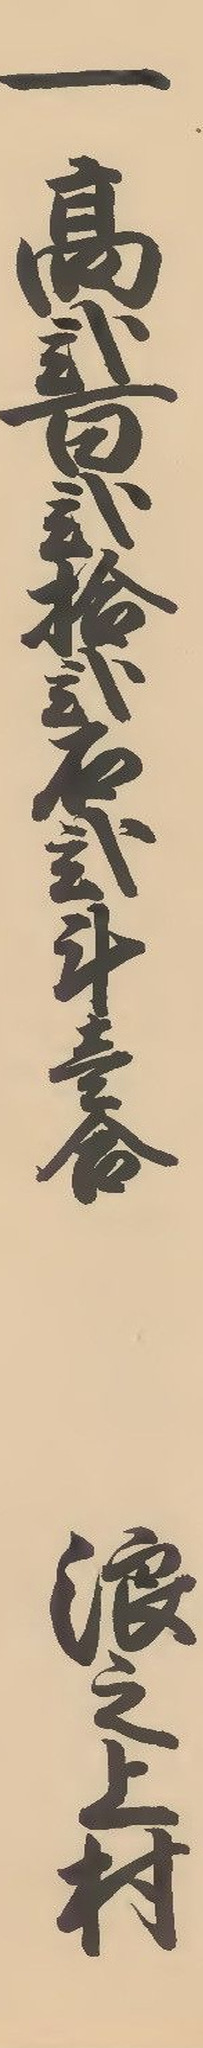一高弐百弐拾弐石弐斗壱合浪之上村
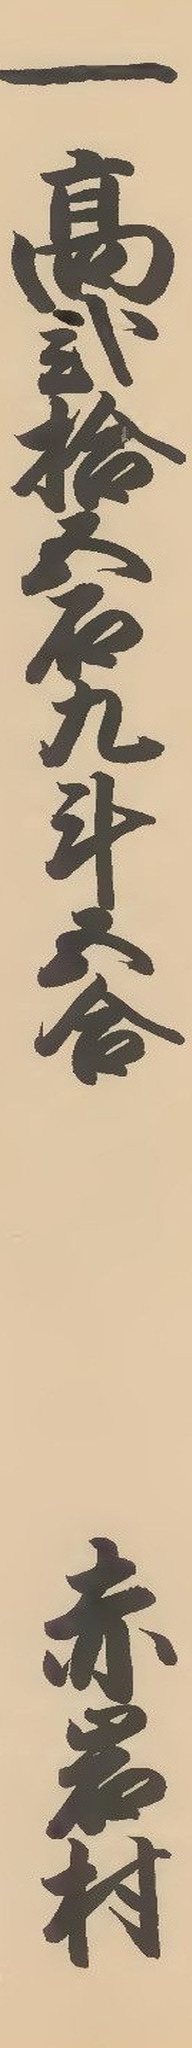一高弐拾五石九斗五合赤岩村
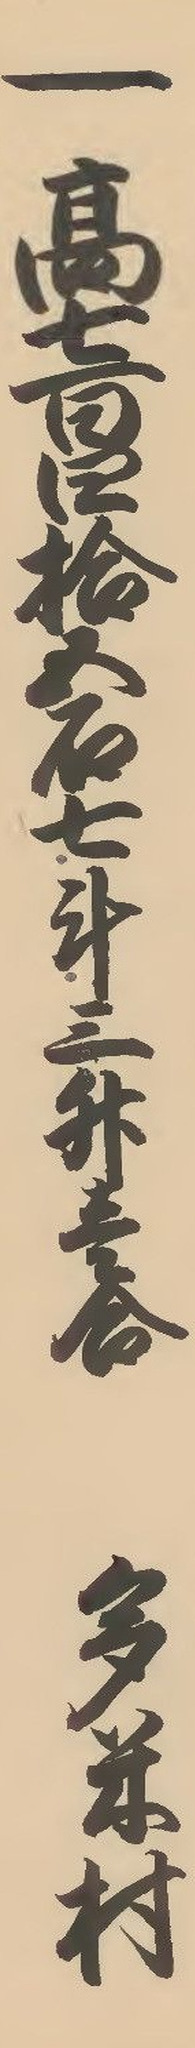一高七百四拾五石七斗三升壱合多米村

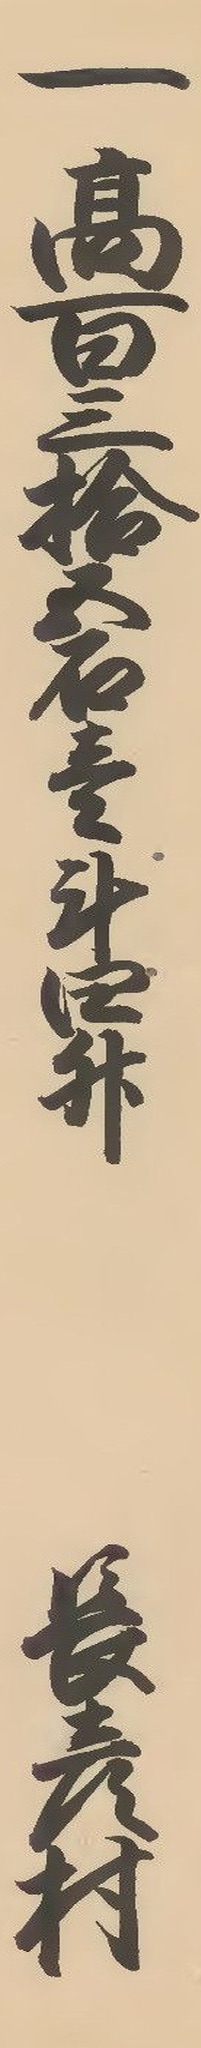一高百三拾五石壱斗四升長彦村
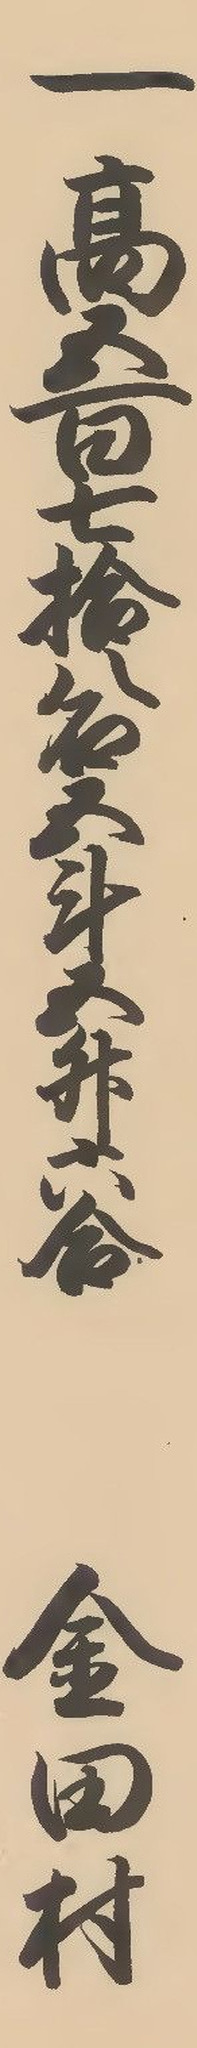一高五百七拾八石五斗五升六合金田村
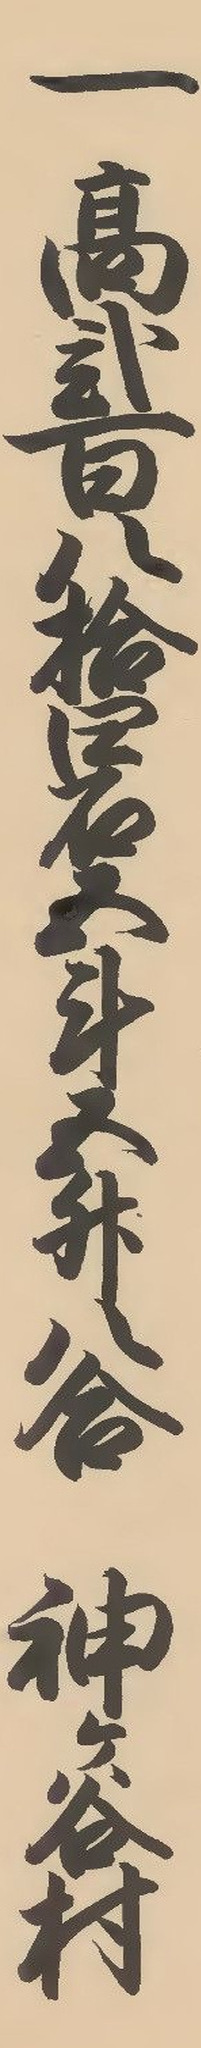一高弐百八拾四石五斗五升八合神ヶ谷村
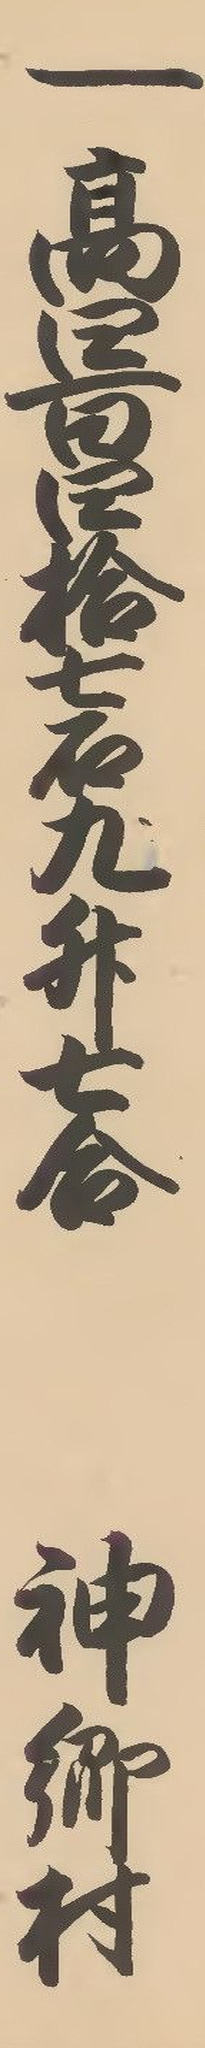一高四百四拾七石九升七合神郷村
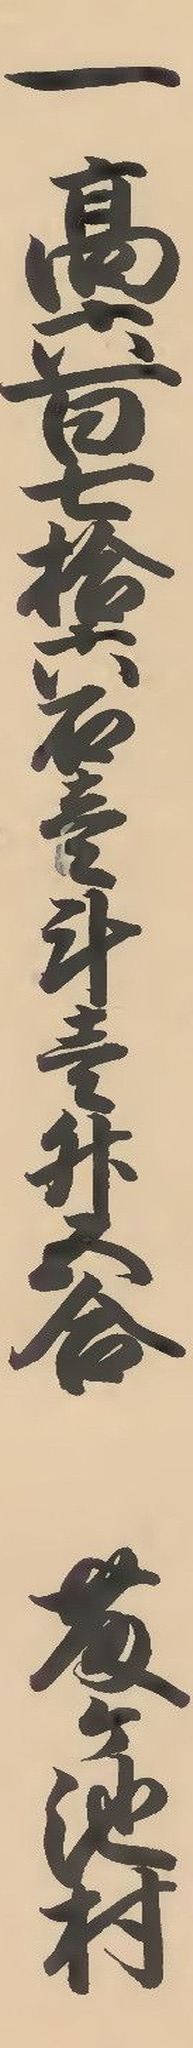一高六百七拾六石壱斗壱升五合藤ヶ池村
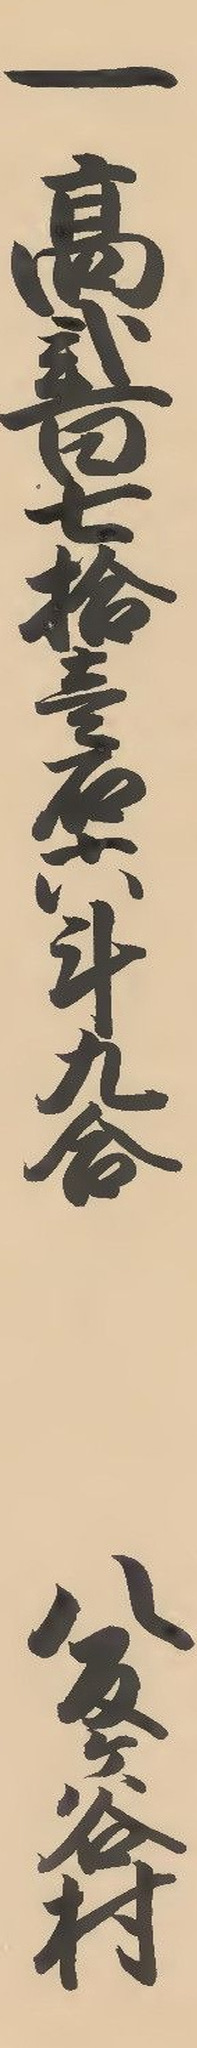一高弐百七拾壱石六斗九合八反ヶ谷村
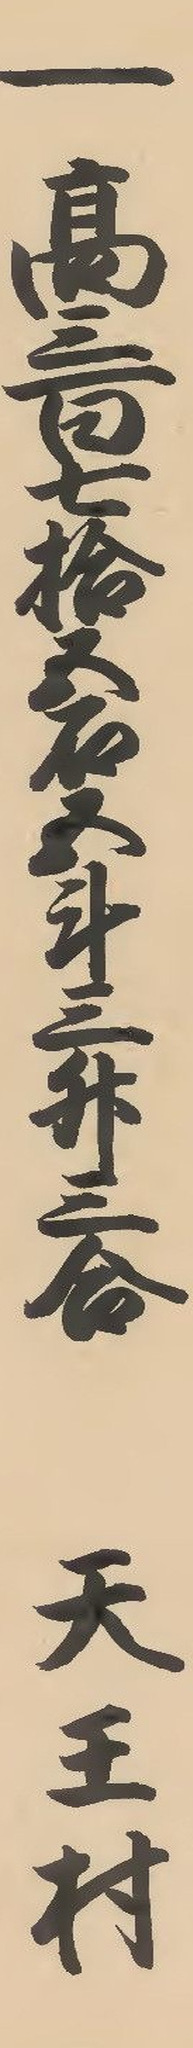一高三百七拾五石五斗三升三合天王村
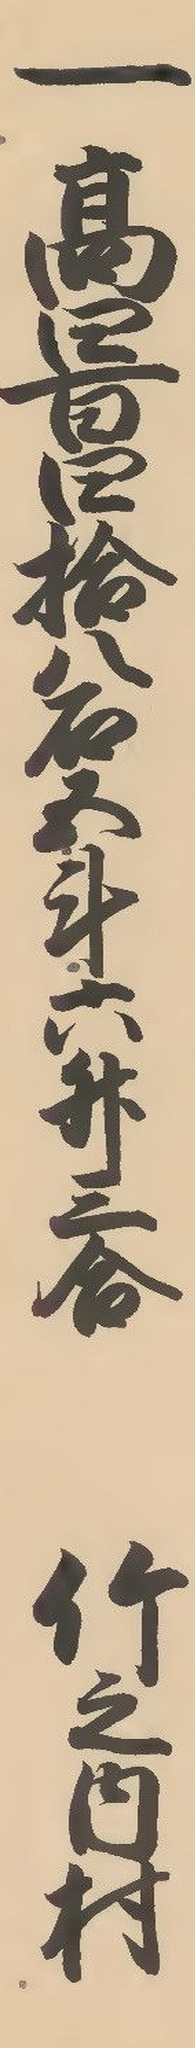一高四百四拾八石五斗六升三合竹之内村

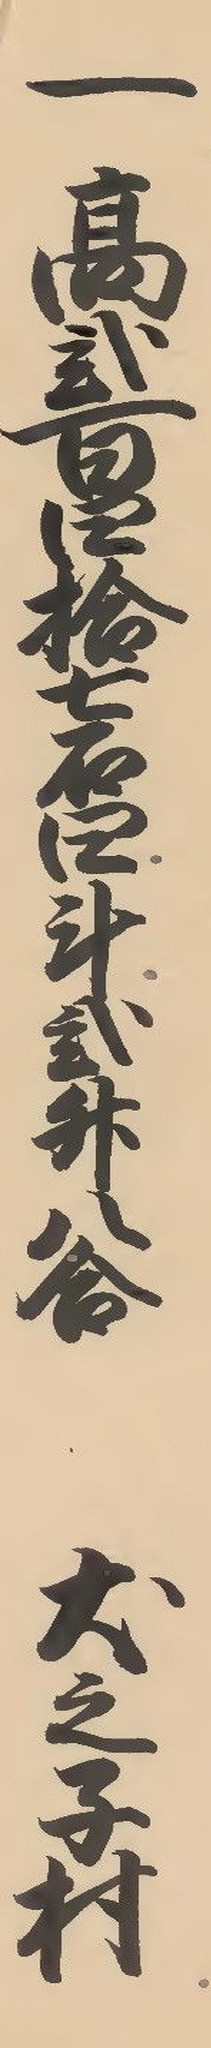一高弐百四拾七石四斗弐升八合犬之子村
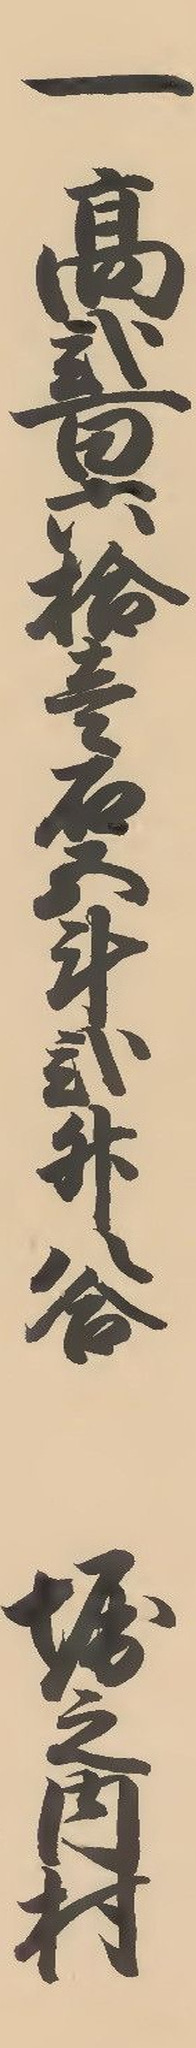一高弐百六拾壱石五斗弐升八合堀之内村
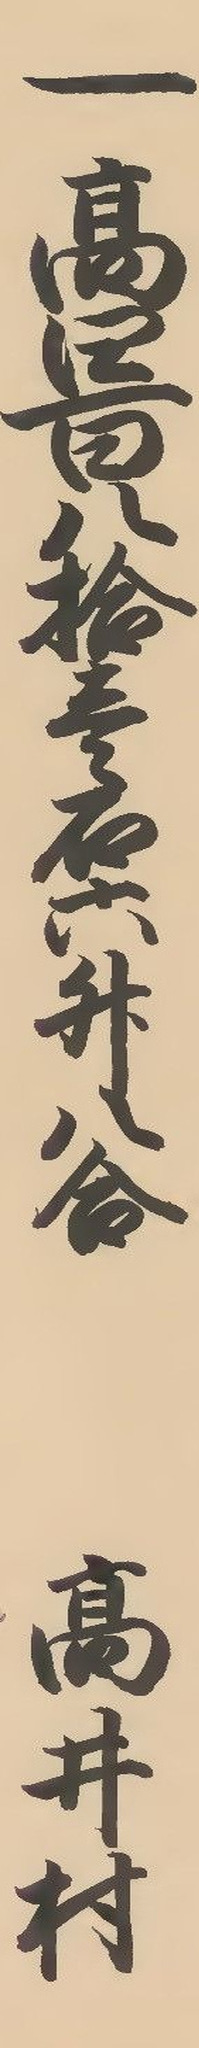一高四百八拾壱石六升八合高井村
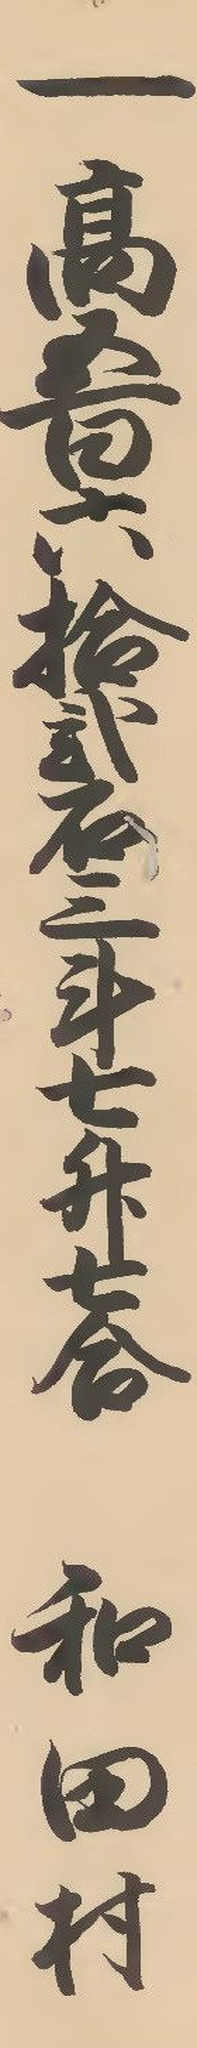一高五百六拾弐石三斗七升七合和田村
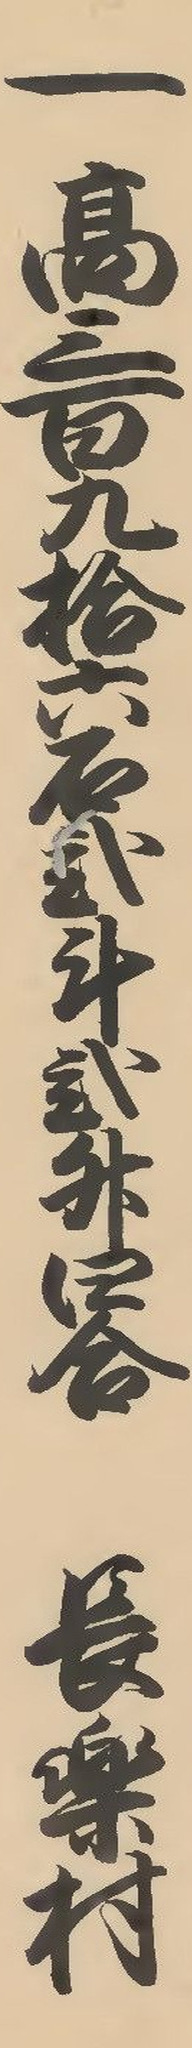一高三百九拾六石弐斗弐升四合長楽村
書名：三河国郷帳
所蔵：国立公文書館 National Archives of Japan
